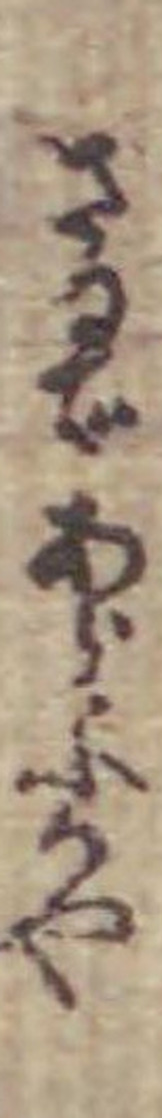さるであらふかや

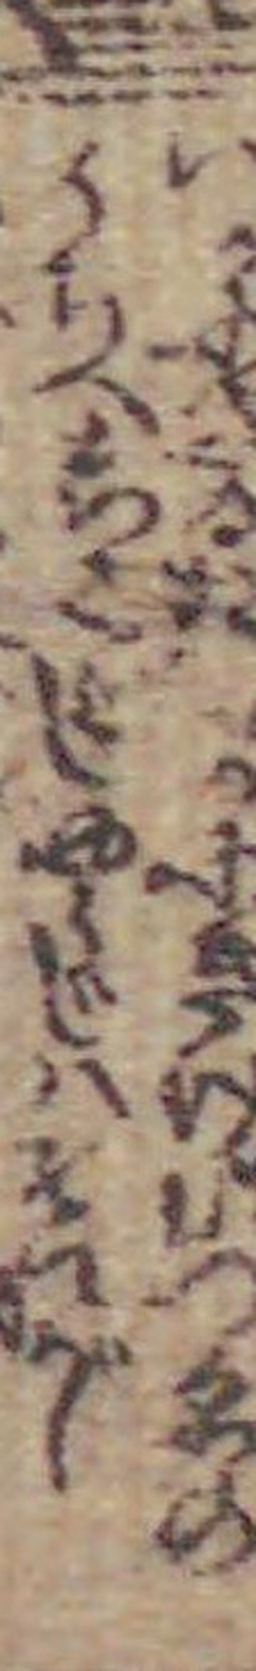うちへしこみしやうじはそれがし
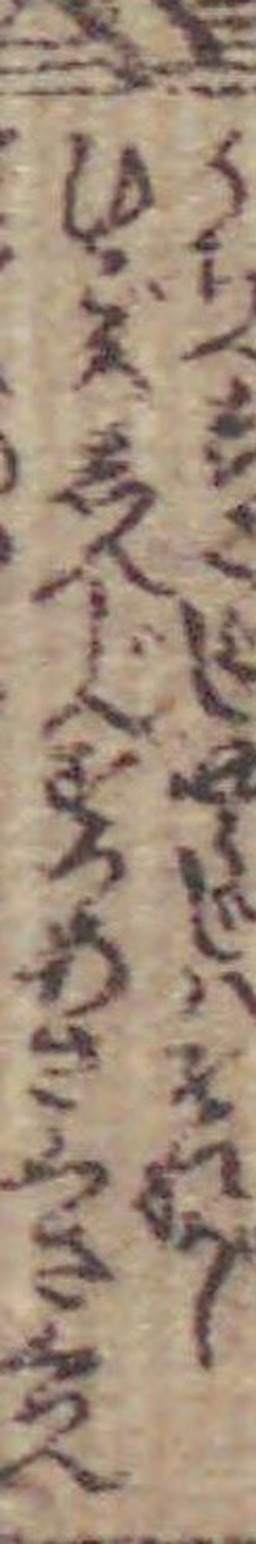ひごろしんじんするあさくさくはん
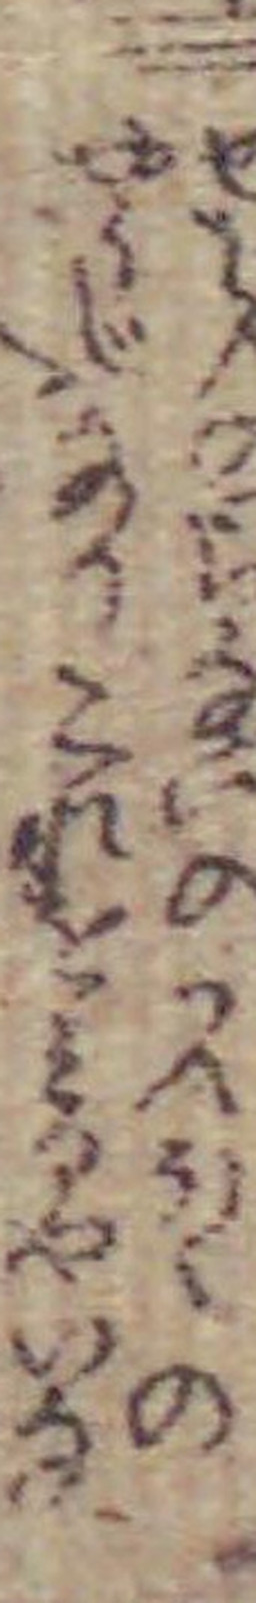やうじなりこれをみるやい
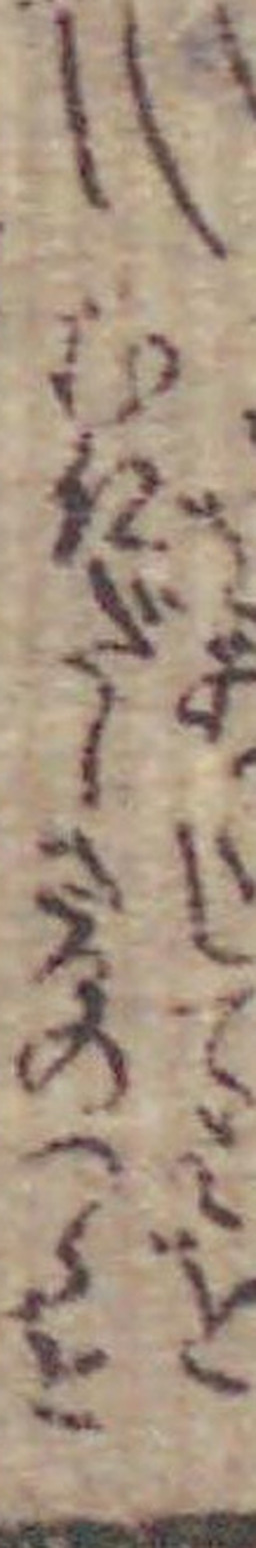むきだしさるのつらを
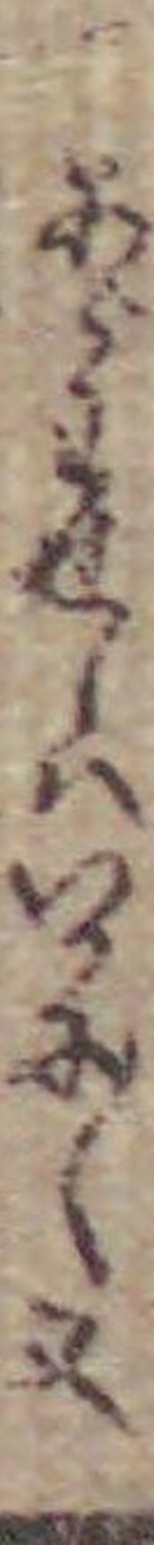あらわせしはいかに〱又
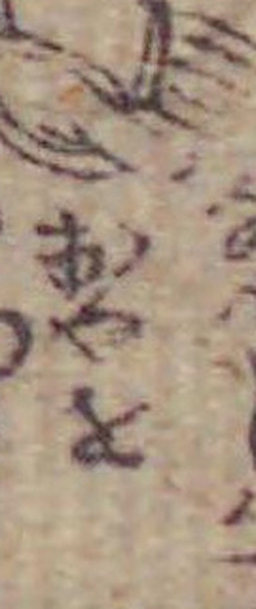おやを
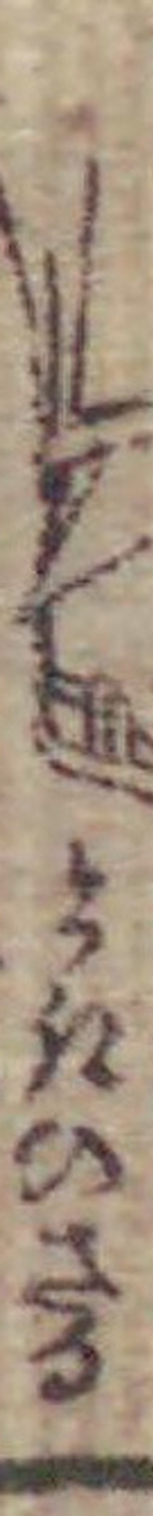ときのさる
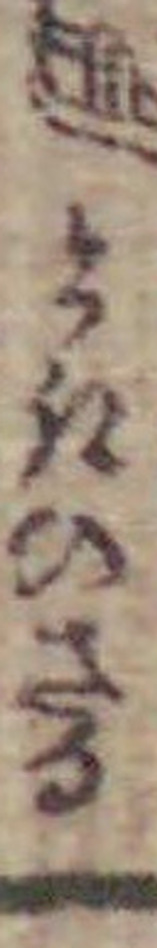ときのさる
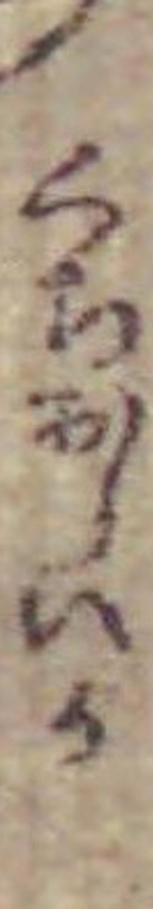くちおしいか
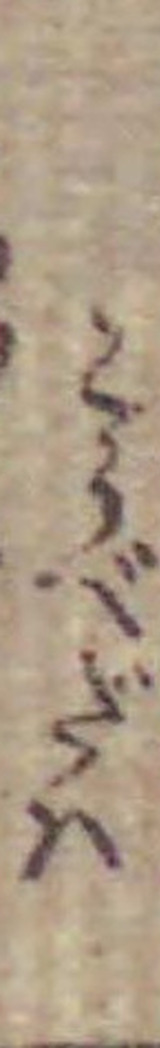こうべだは
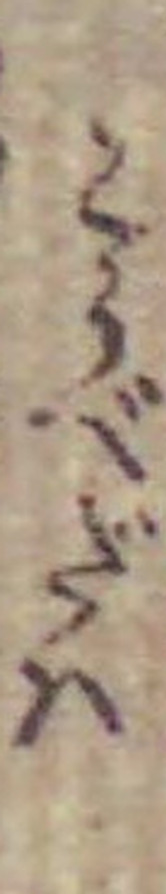こうべだは
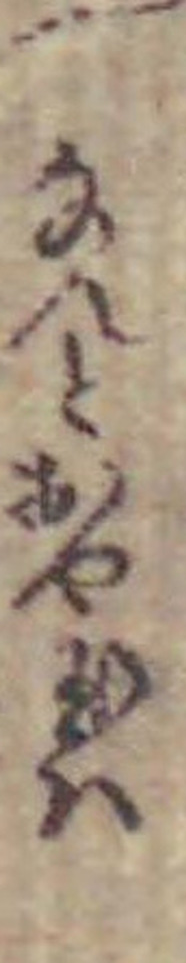なんとおや玉は
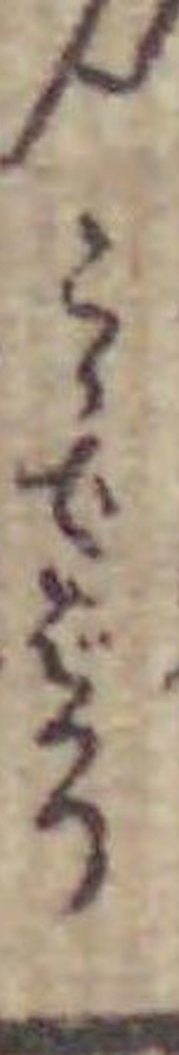こゝでばかり
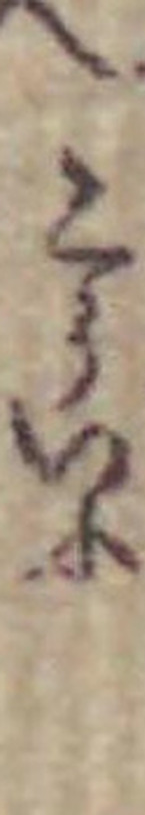こういふ
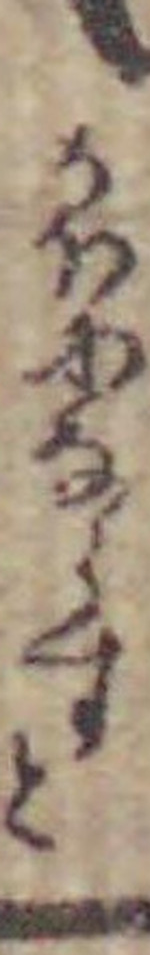かほにならすと
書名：交古勢昔咄 : 2巻
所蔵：国立国会図書館 National Diet Library, JAPAN
